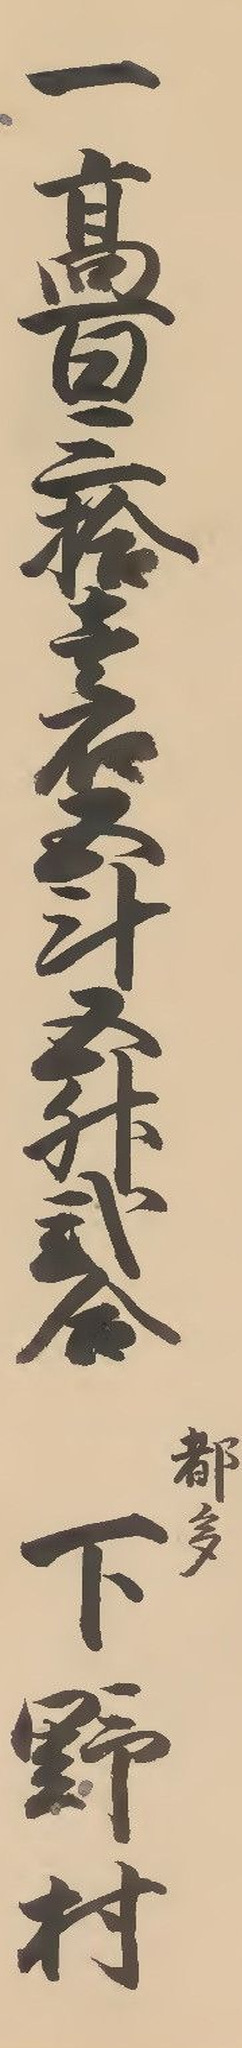一髙百三拾壱石五斗五升弐合下野村
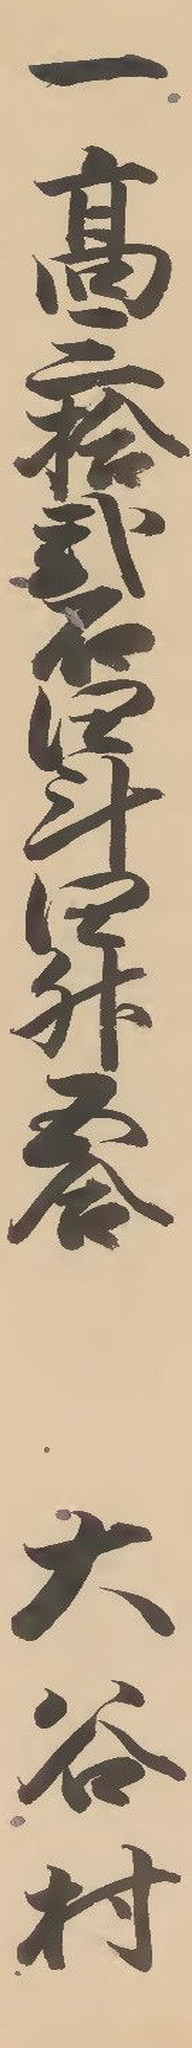一髙三拾弐石四斗四升五合大谷村

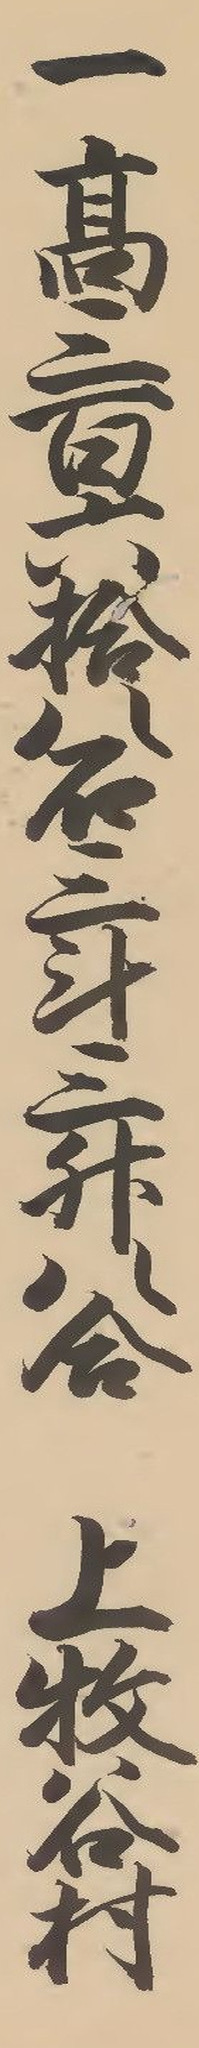一髙三百六拾八石三斗三升八合上牧谷村
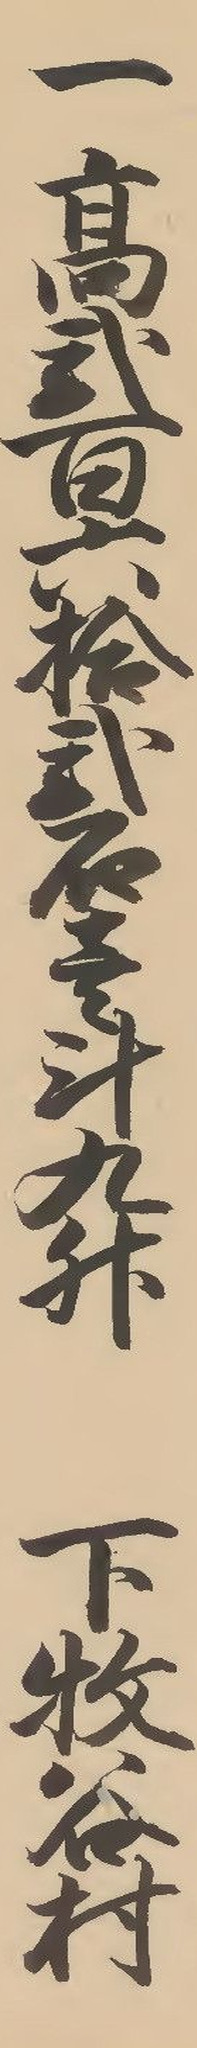一髙弐百六拾弐石壱斗九升下牧谷村
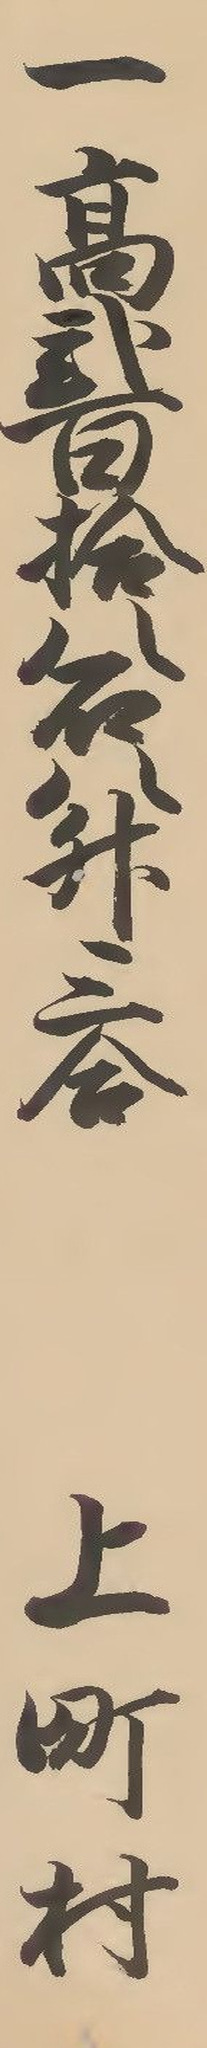一髙弐百拾八石八升三合上町村
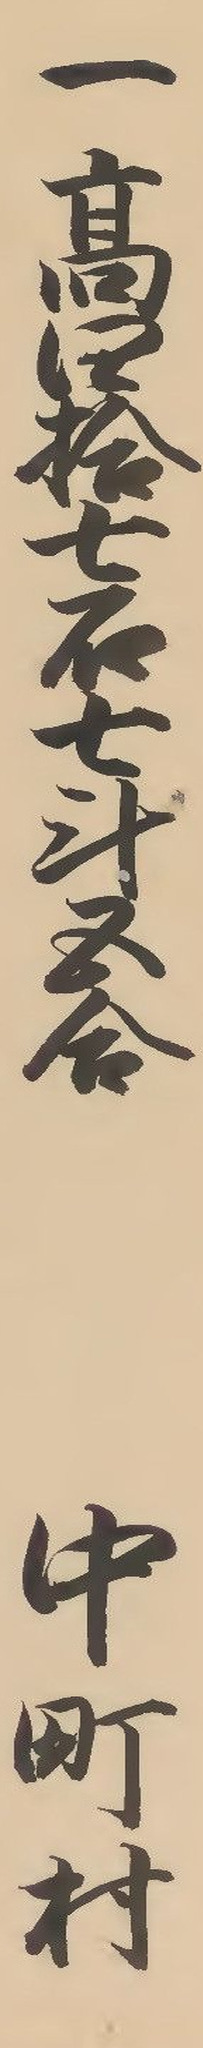一髙四拾七石七斗五合中町村
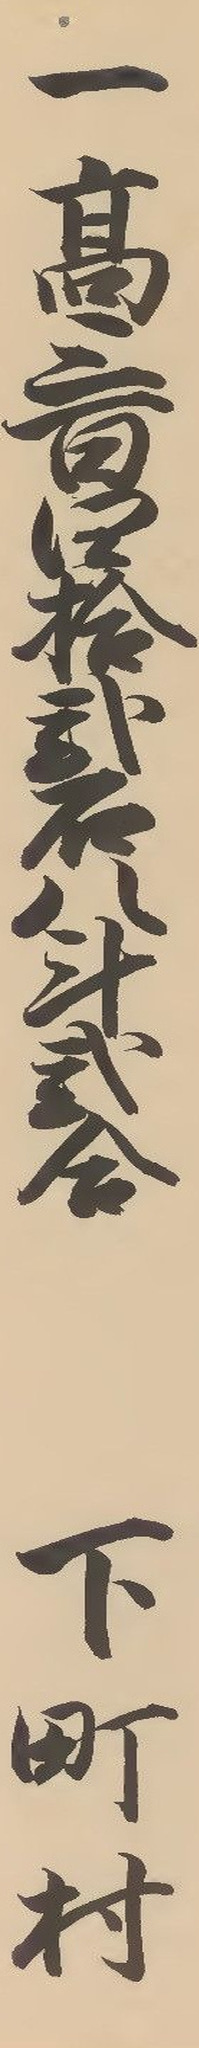一髙三百四拾弐石八斗弐合下町村
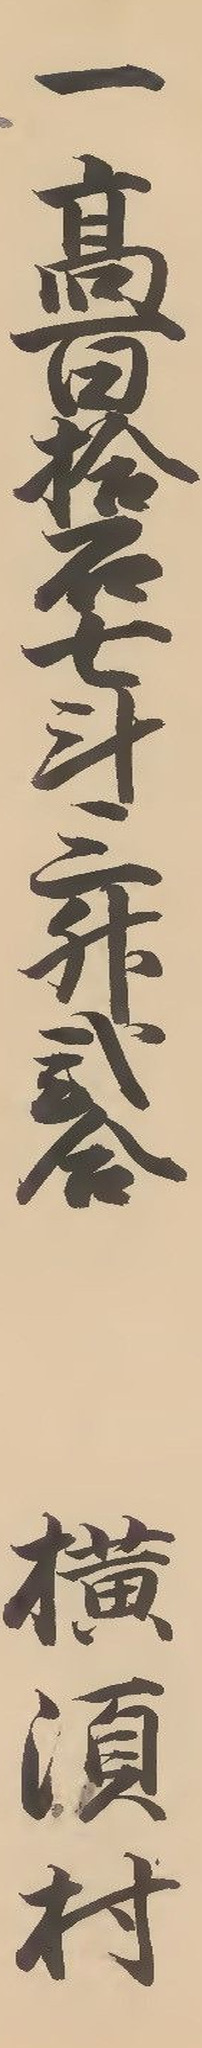一髙百拾石七斗三升弐合横須村
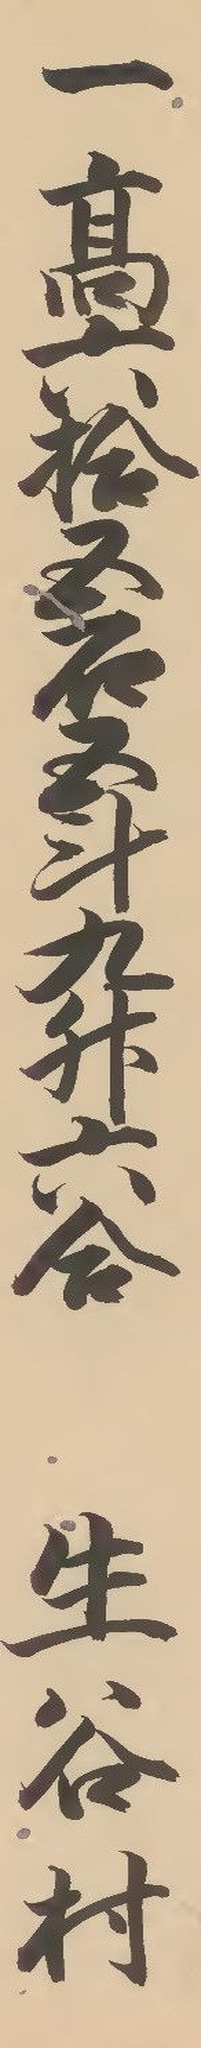一髙六拾五石五斗九升六合生谷村

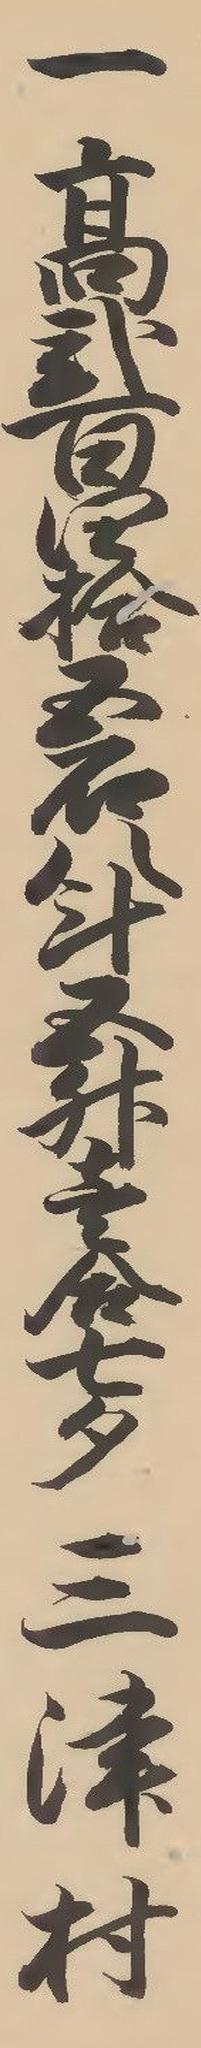一髙弐百四拾五石八斗五升壱合七夕三津村
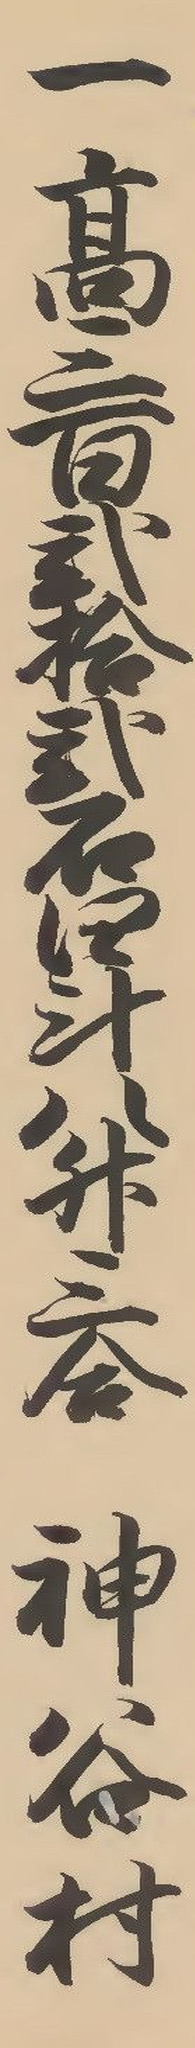一髙三百弐拾弐石四斗八升三合神谷村
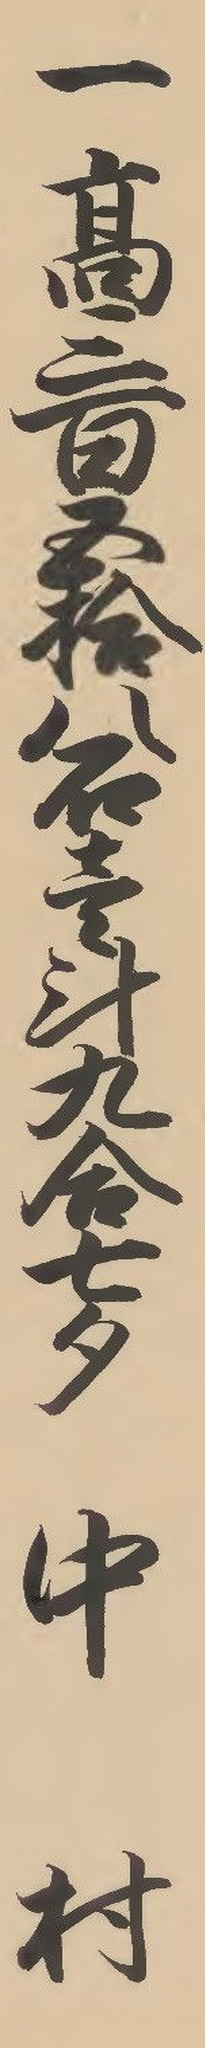一髙三百五拾八石壱斗九合七夕中村
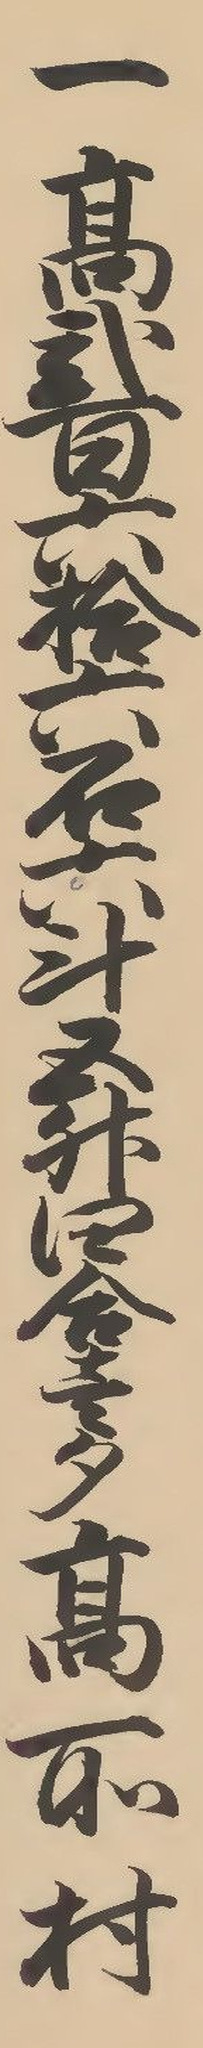一髙弐百六拾六石六斗五升四合壱夕髙所村
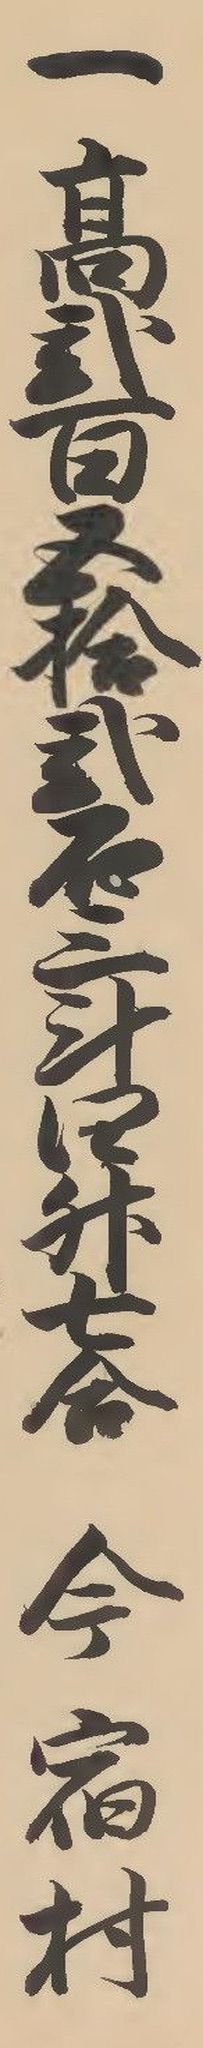一髙弐百五拾弐石三斗四升七合今宿村
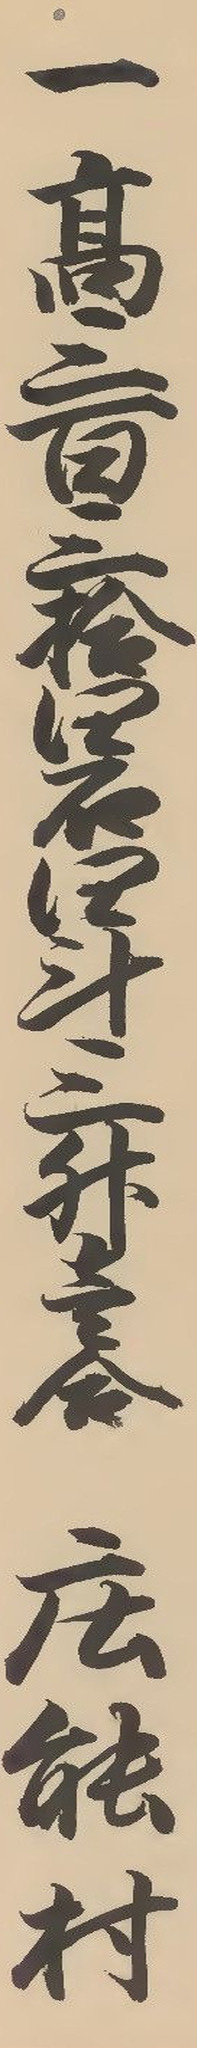一髙三百三拾四石四斗三升壱合庄能村
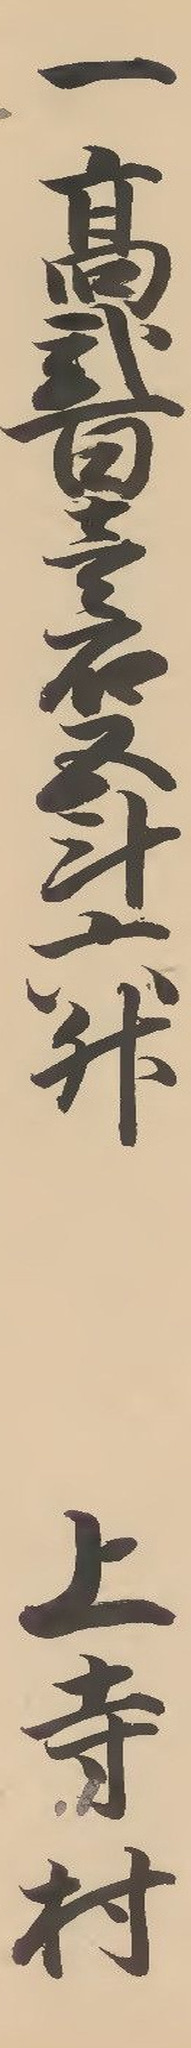一髙弐百壱五斗六升上寺村
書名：播磨国郷帳
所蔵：国立公文書館 National Archives of Japan
